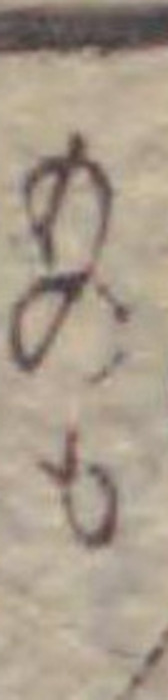ものも
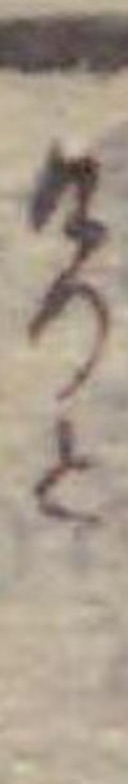けりと
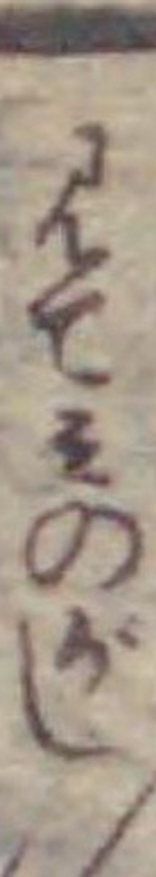見てみのがし
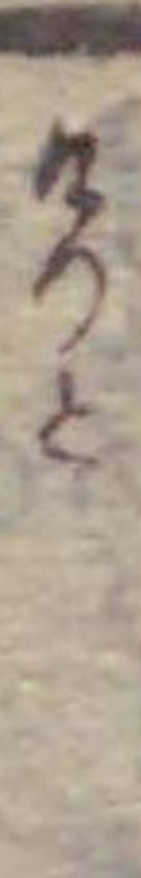けりと
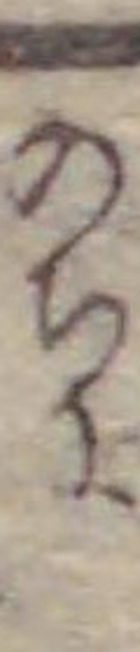のちに
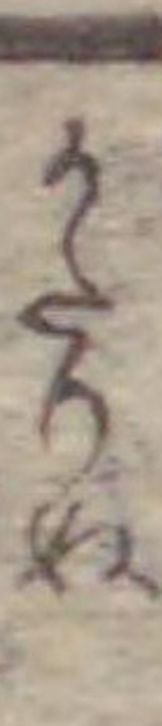かたりぬ
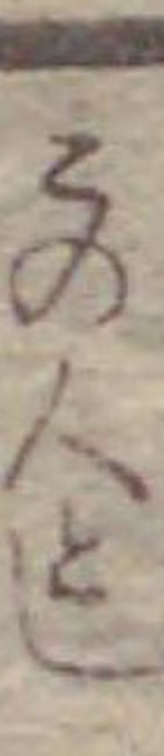この人とし
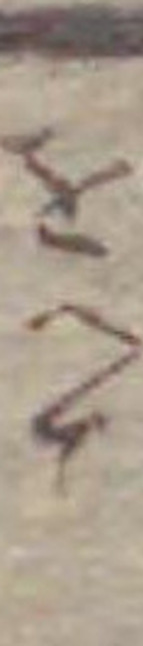をへて
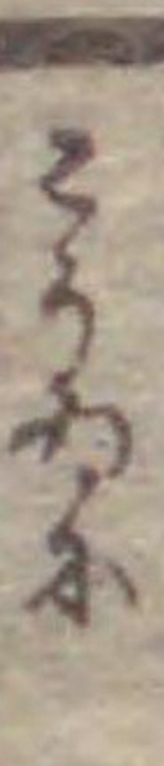こうゐに
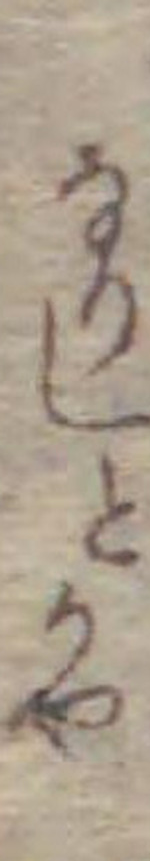なりしとかや

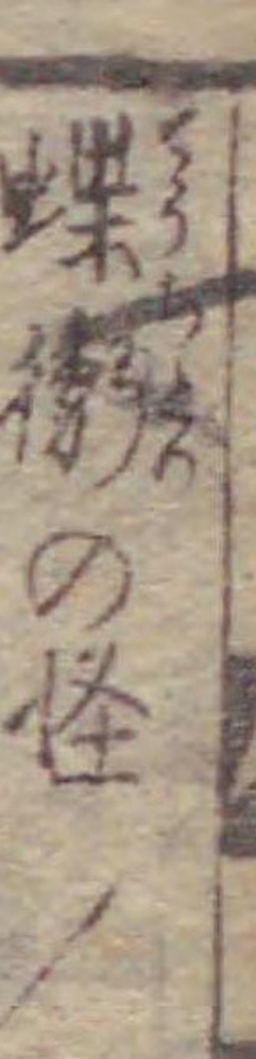蝶鵆の怪
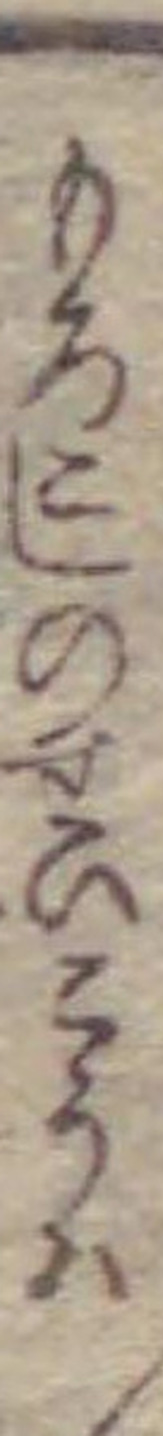もろこしのせいこうは
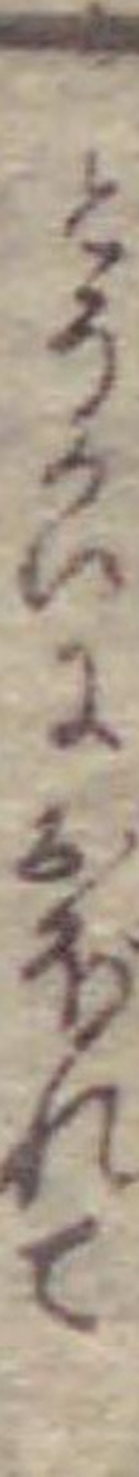とうかいにおぼれて
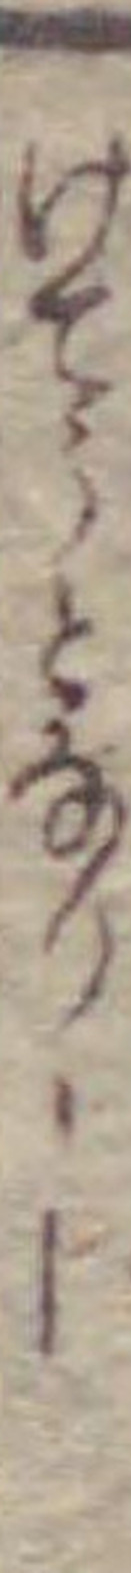けてうとなりし
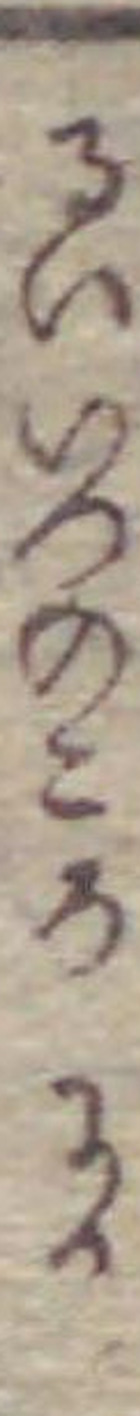るいいつのころにか
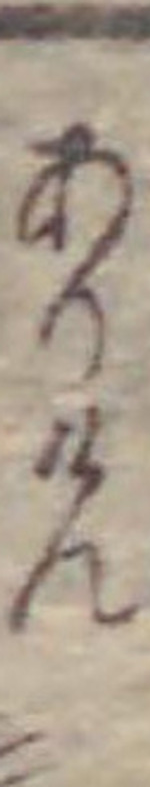ありけん
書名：武家物奇談 : 3巻
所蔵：国立国会図書館 National Diet Library, JAPAN
